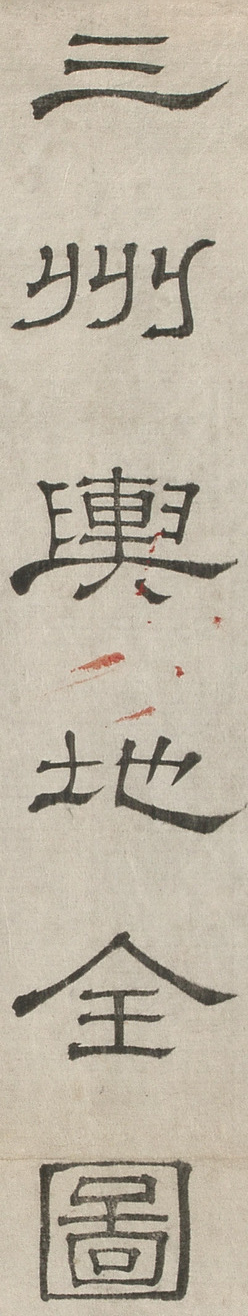三州輿地全図

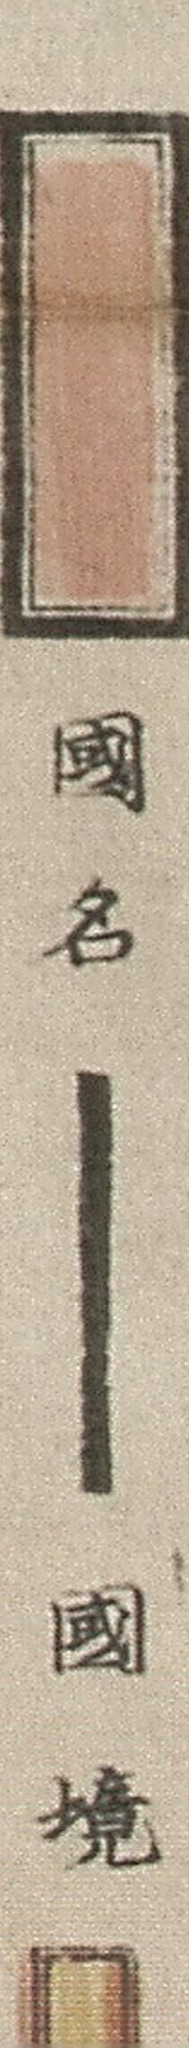国名国境

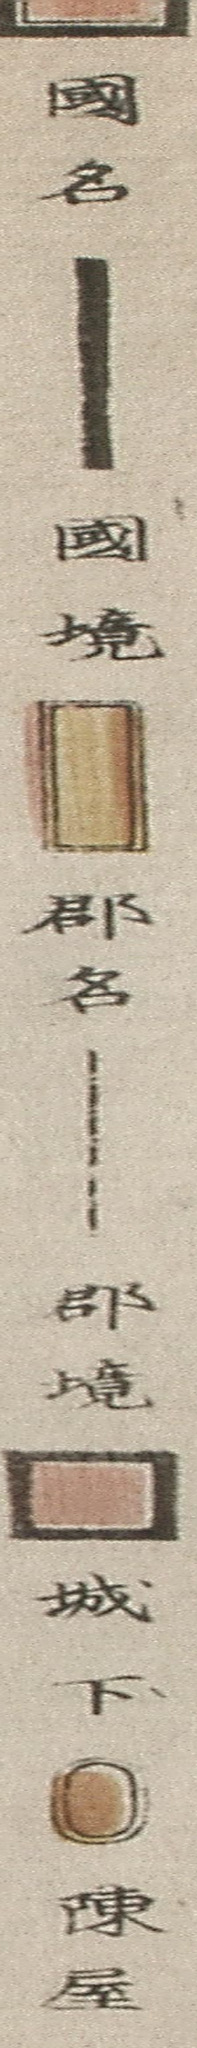国名国境郡名郡境城下陳屋

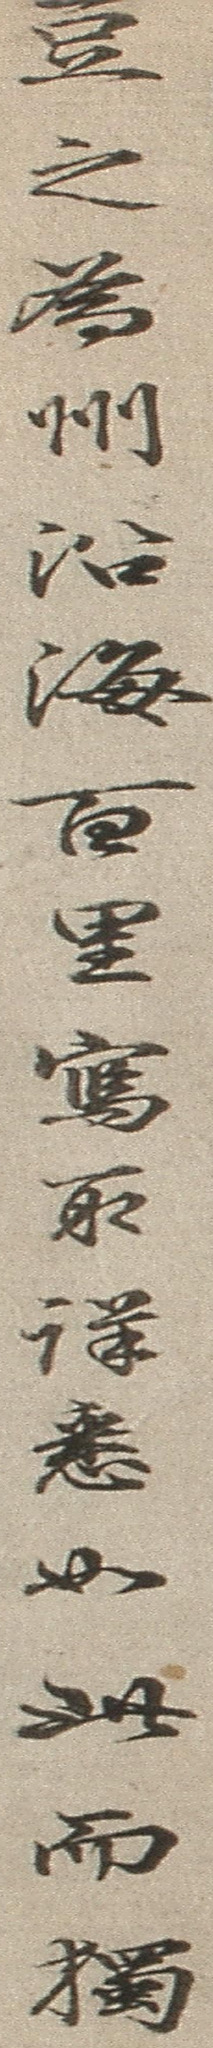豆之為州沿海百里写取詳悉如此而独
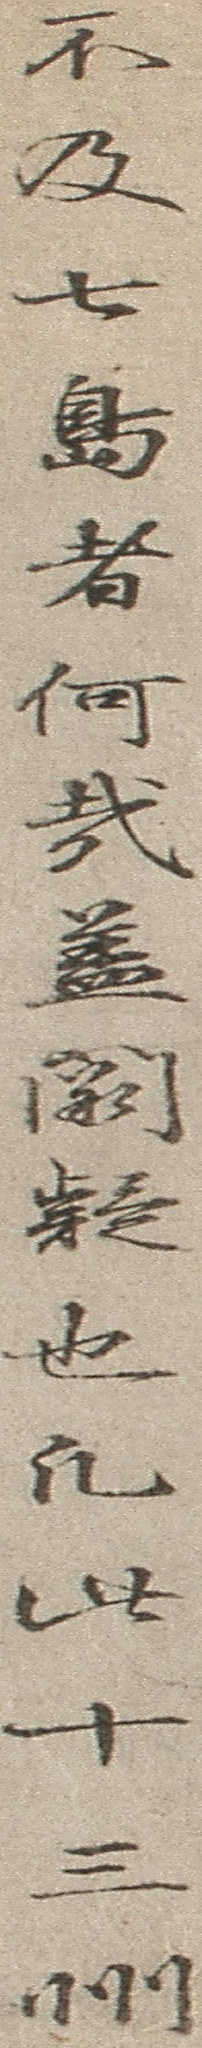不及七島者何哉蓋闕疑也凡此十三州
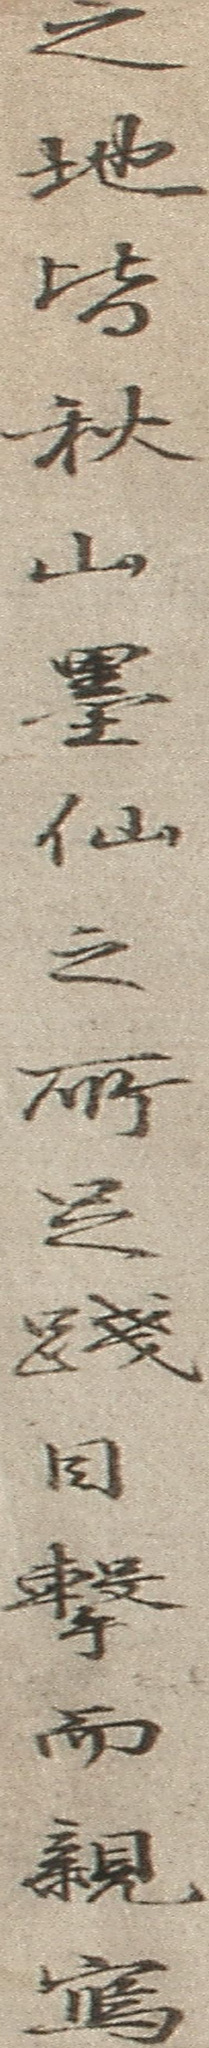之地皆秋山墨仙之所足践目撃而親写
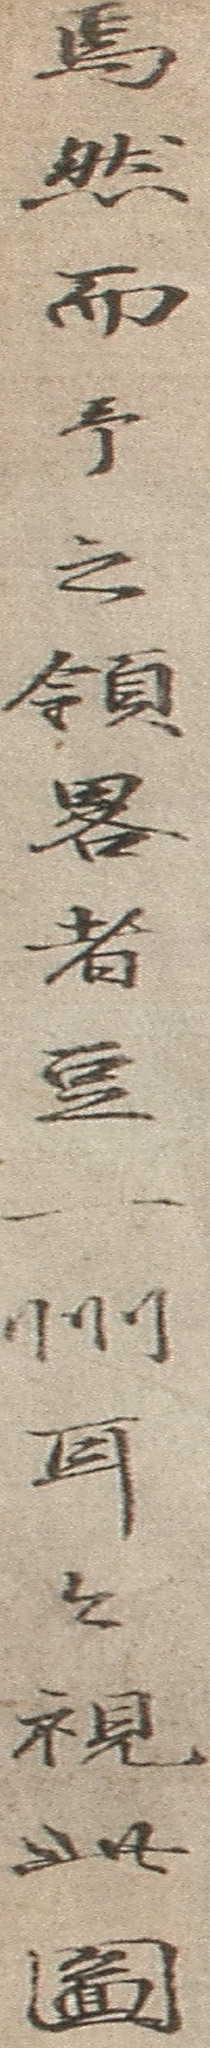焉然而予之領略者豆一州耳今視此図
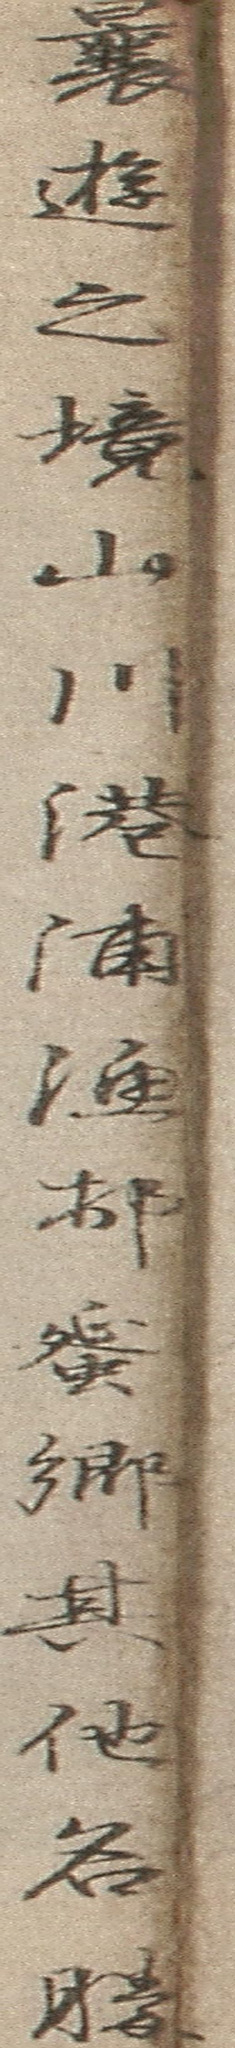曩遊之境山川港浦漁都蜑郷其他名勝
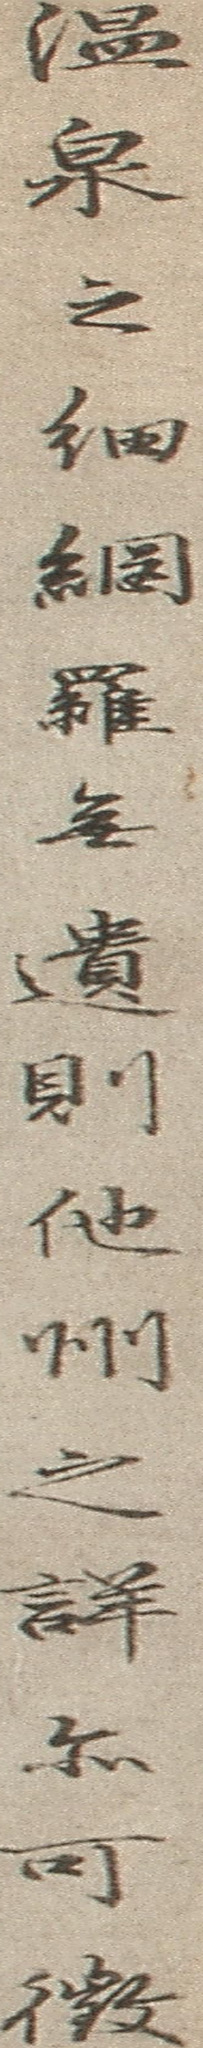温泉之細網羅無遺則他州之詳品可徴
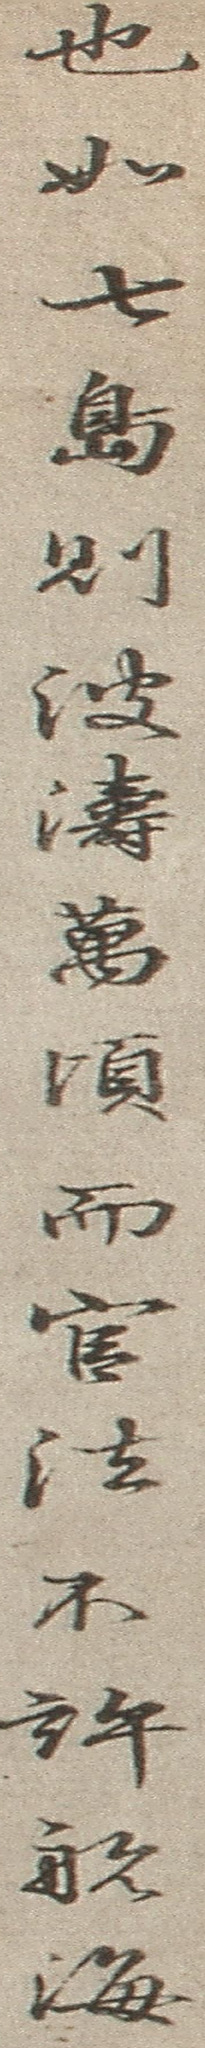也如七島則波濤萬頃而官法不許航海
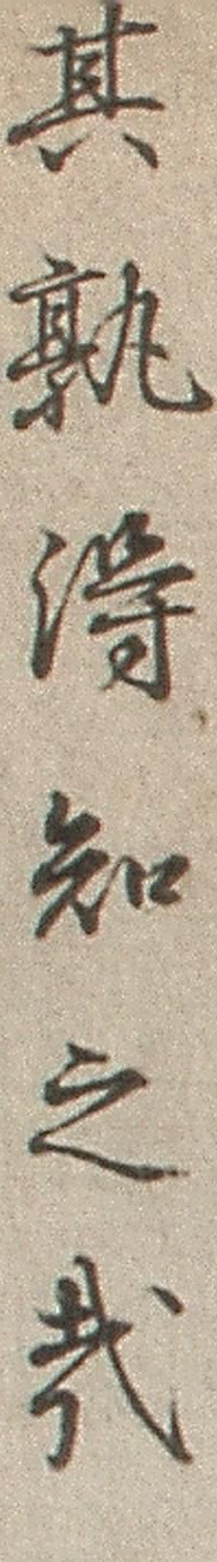其孰得知之哉
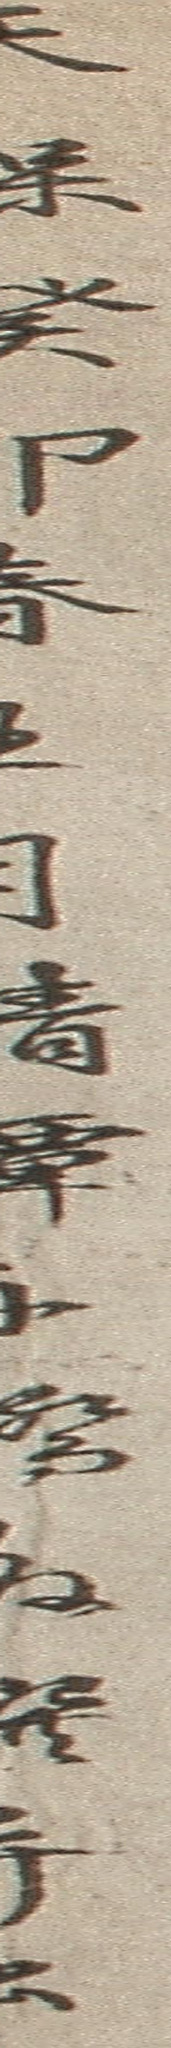天保癸卯春王月晴潭舟橋徴撰并書

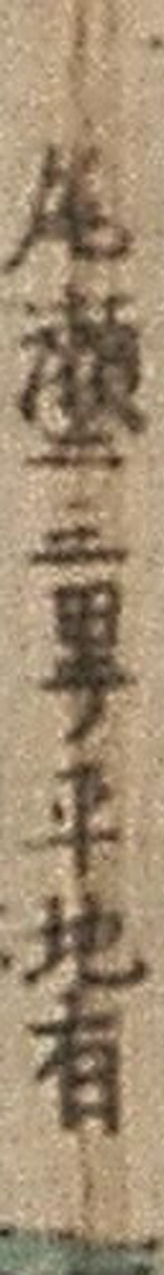尾瀬二三里ノ平地有
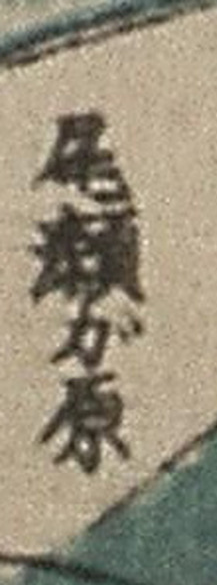尾瀬ガ原
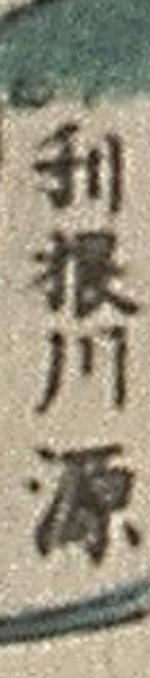利根川源

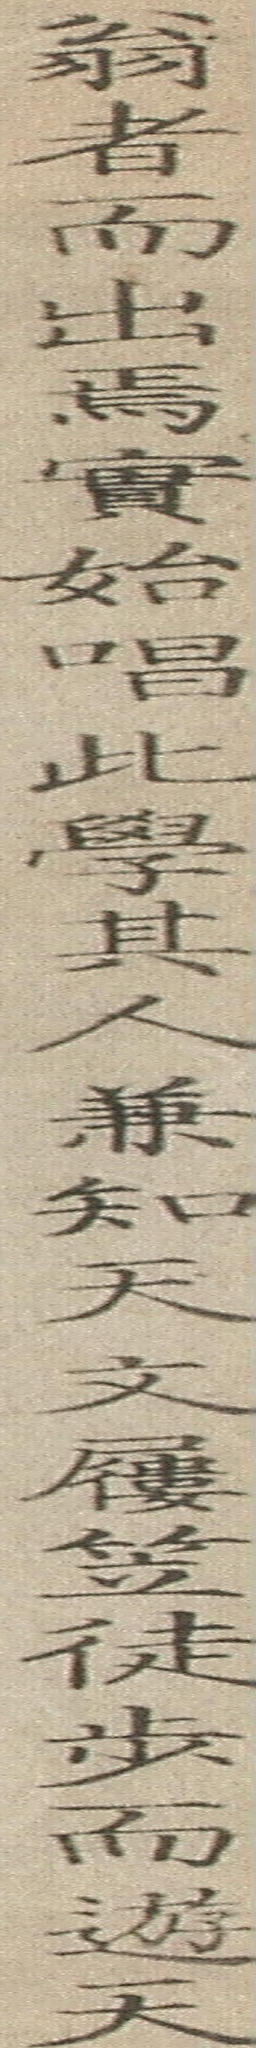翁者而出焉実始唱此学其人兼知天文。屨笠徒歩而遊天
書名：冨士見十三州　輿地全圖
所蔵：東京大学地震研究所図書室 Earthquake Research Institute Library, The University of Tokyo, JAPAN
